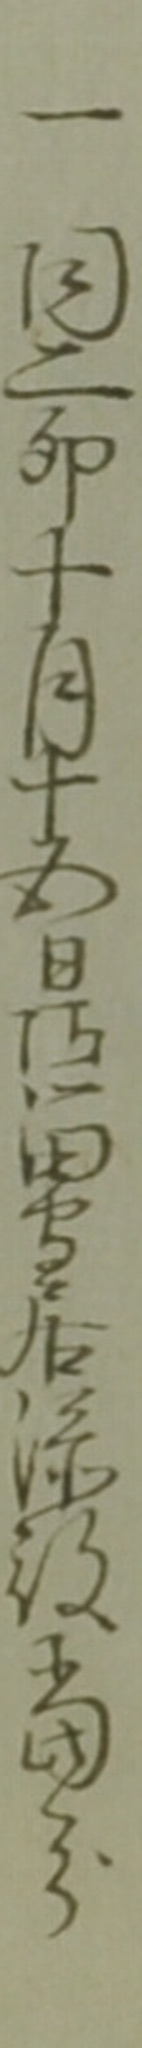一同二卯十月十五日御留守居添役当分
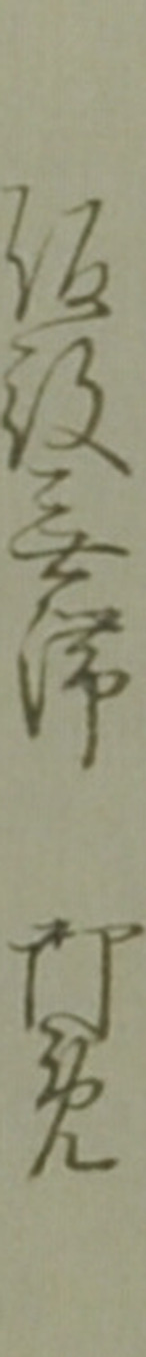仮役無滞御免
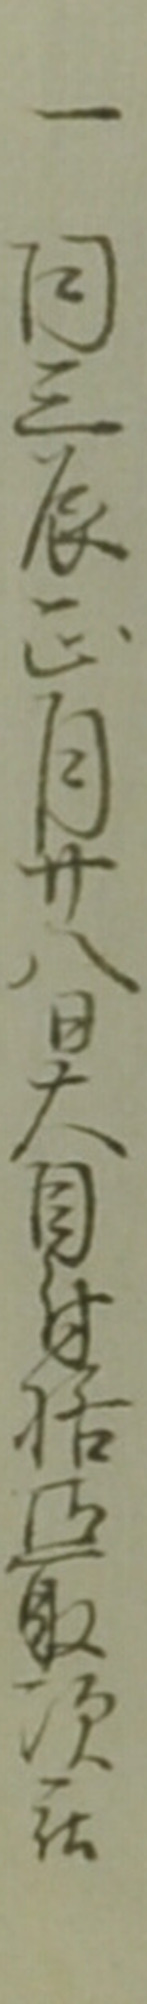一同三辰正月廿八日大目付格御取次被
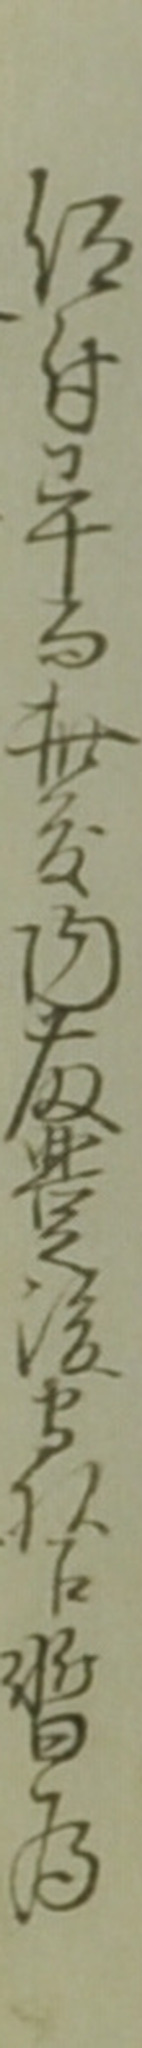仰付畢而此度内藤豊後守様江暫為
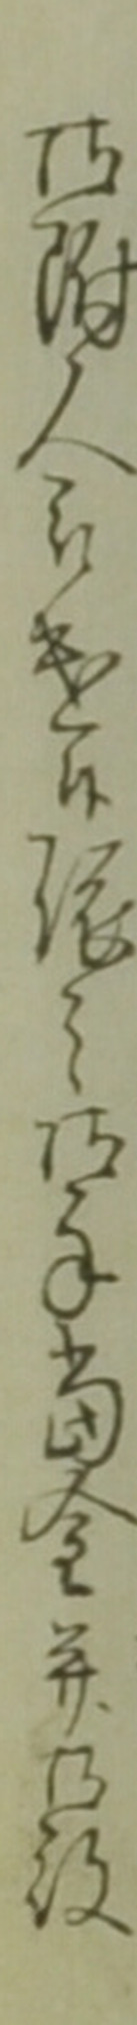御附人被遣候依之御手当勤并御役

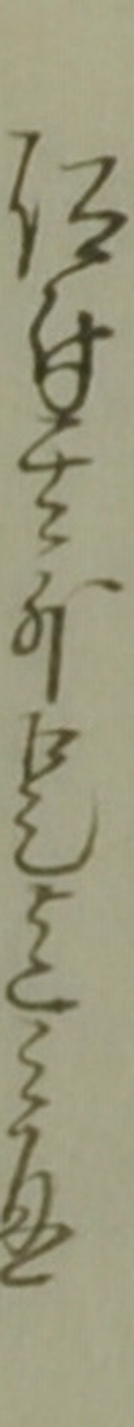仰付其外是迄之通
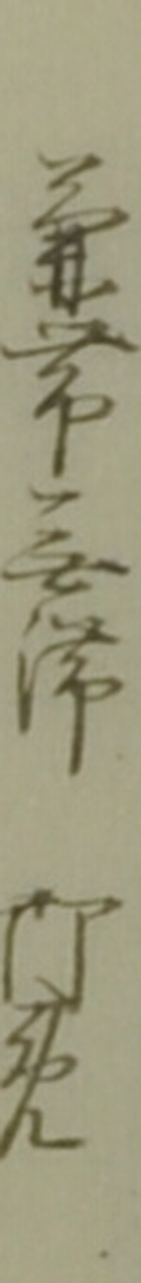兼帯無滞御免
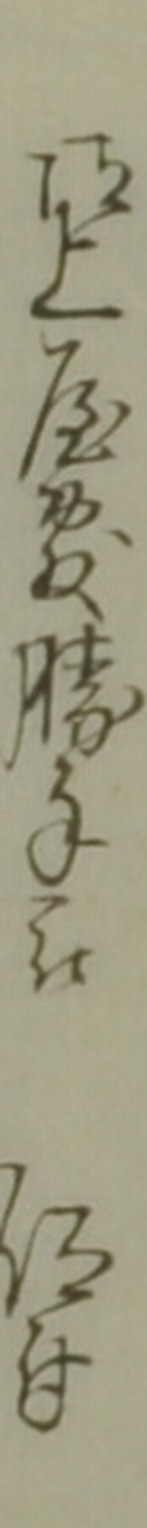御上屋敷勝手被仰付
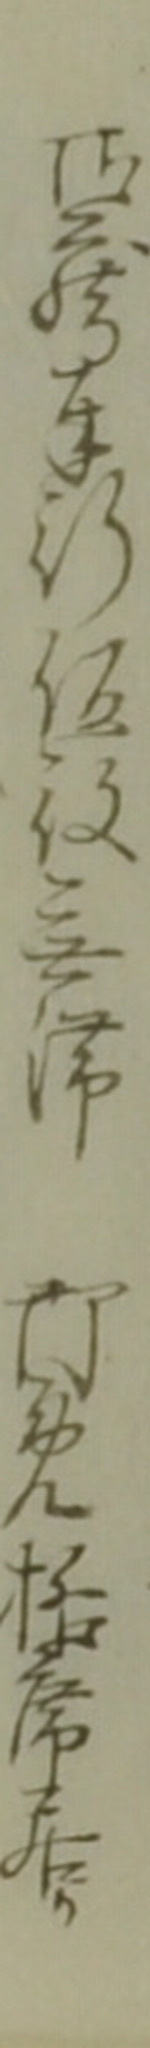御蔵奉行仮役無滞御免格席居リ
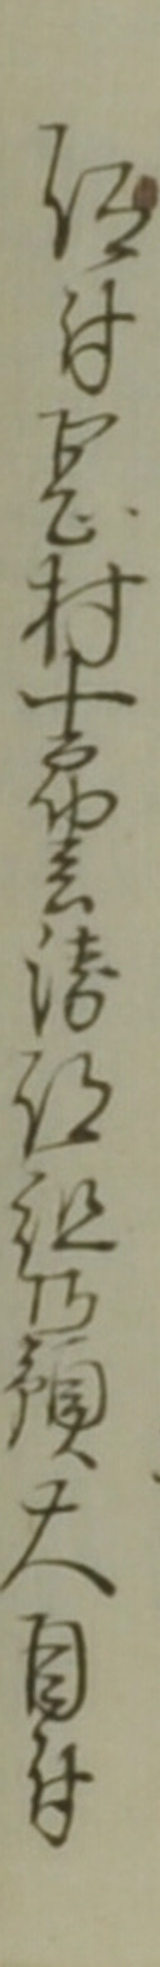仰付岡村十郎兵衛跡組御預大目付
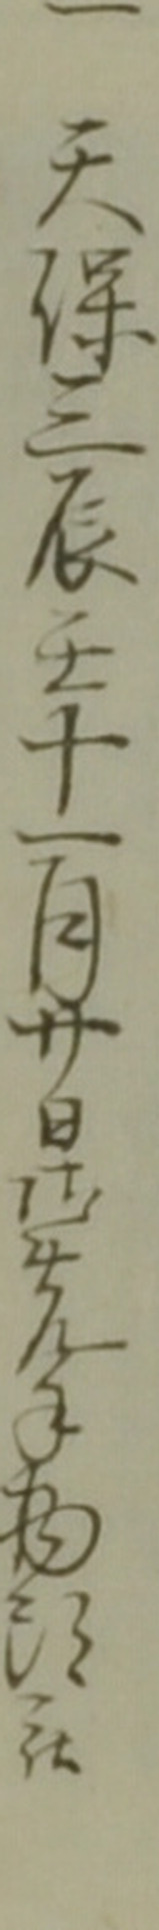一天保三辰閏十一月廿日御先手物頭被
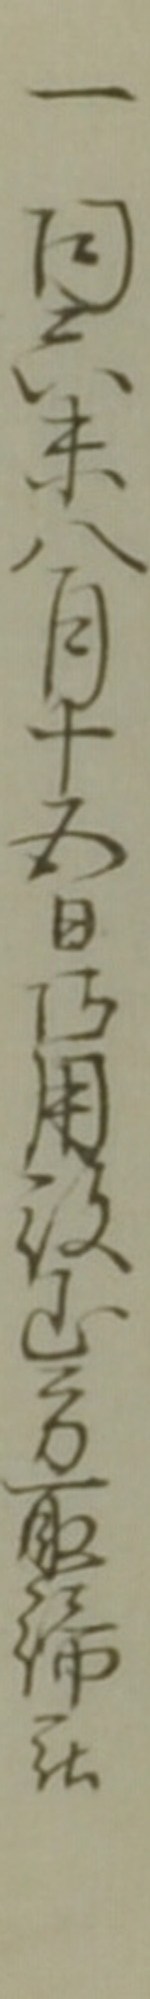一同六未八月十五日御用役山方取締被
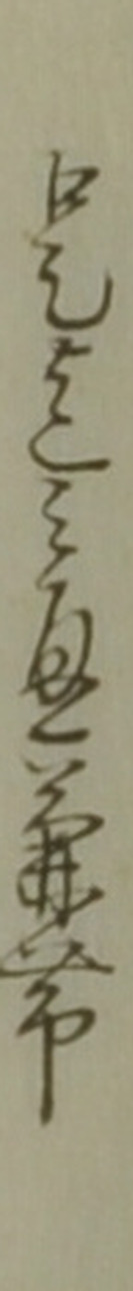是迄之通兼帯
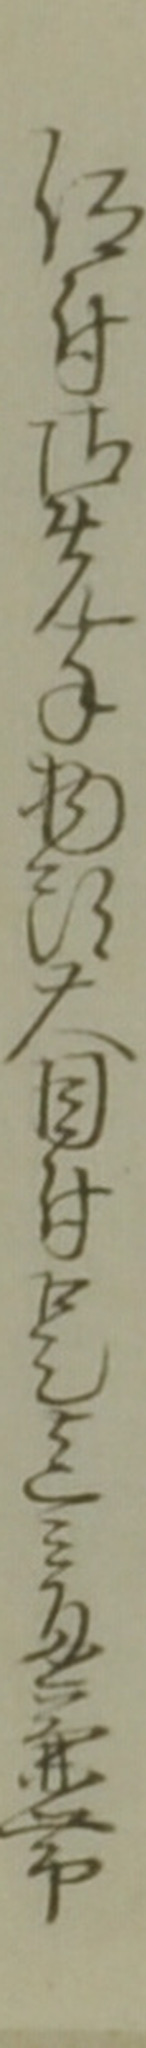仰付御先手物頭大目付是迄之通兼帯
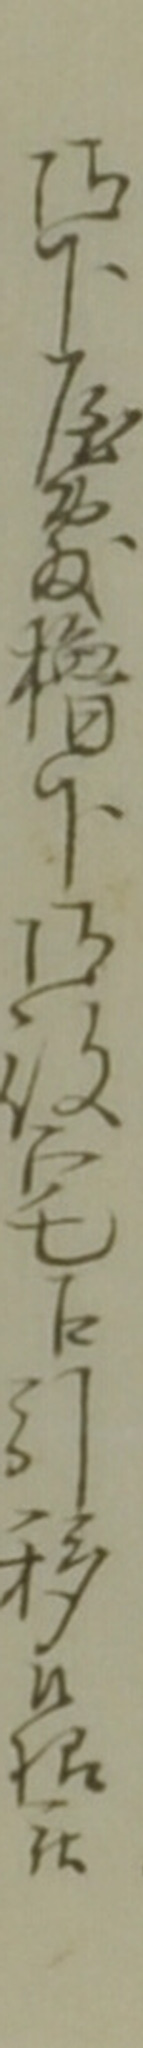御下屋敷櫓下御役宅江引移候様被
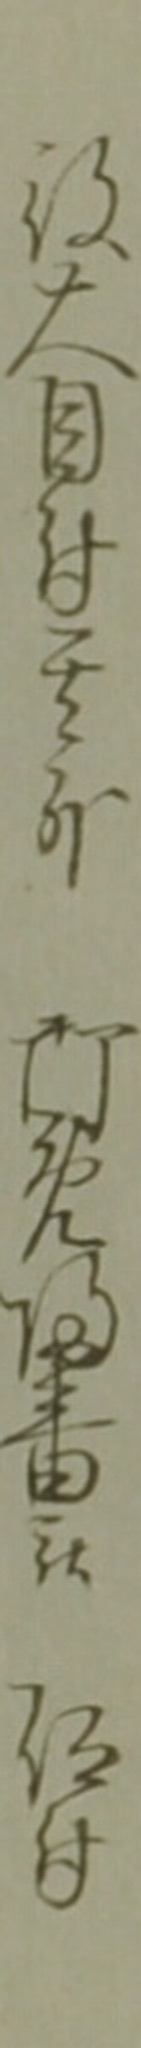役大目付其外御免帰番被仰付
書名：給人諸士勤仕録（三）
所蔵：伊那市立高遠町図書館・合同会社AMANE
